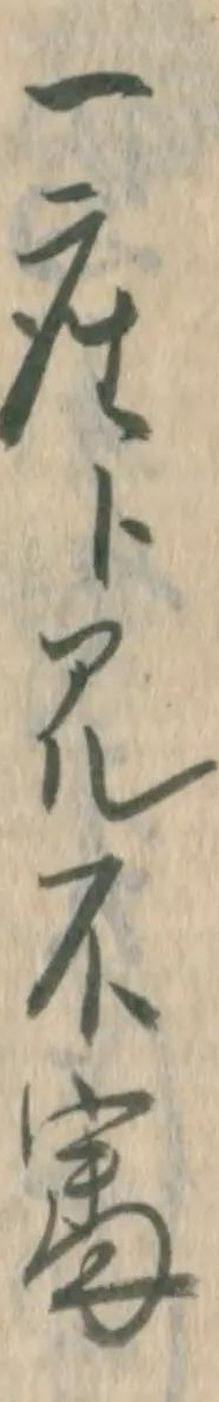一座トアル不審
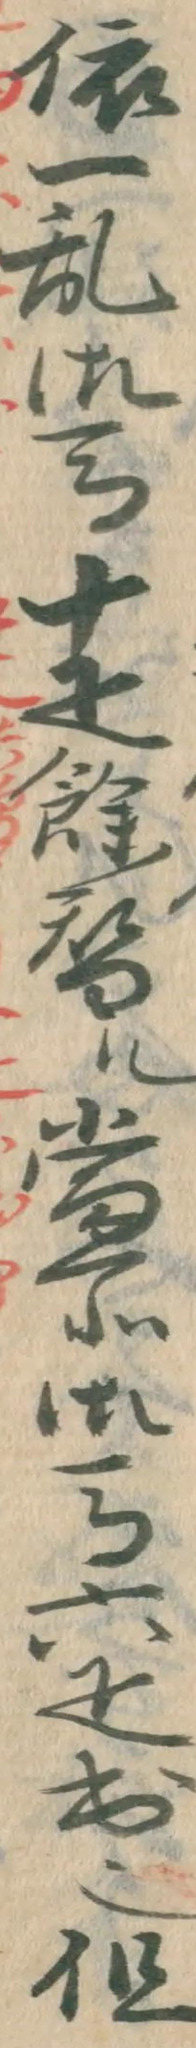依一乱御馬十疋余替ル当所御馬六疋出也但
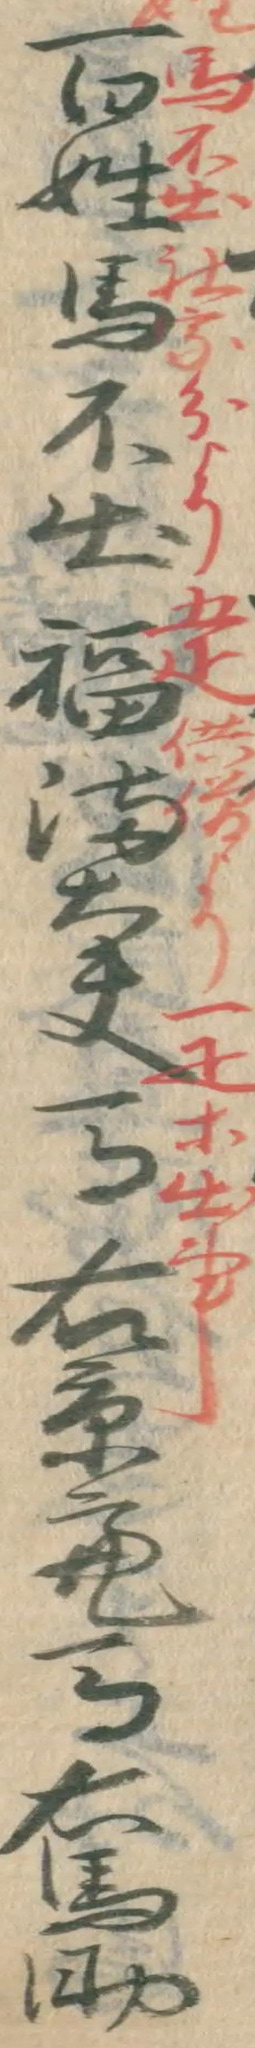百姓馬不出福満大夫馬右京亮馬右馬助
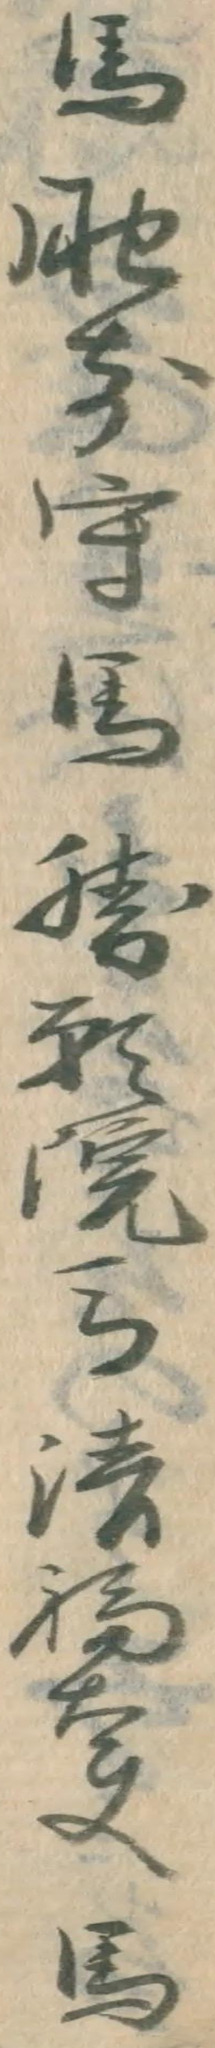馬肥前守馬勝願院馬清福大夫馬

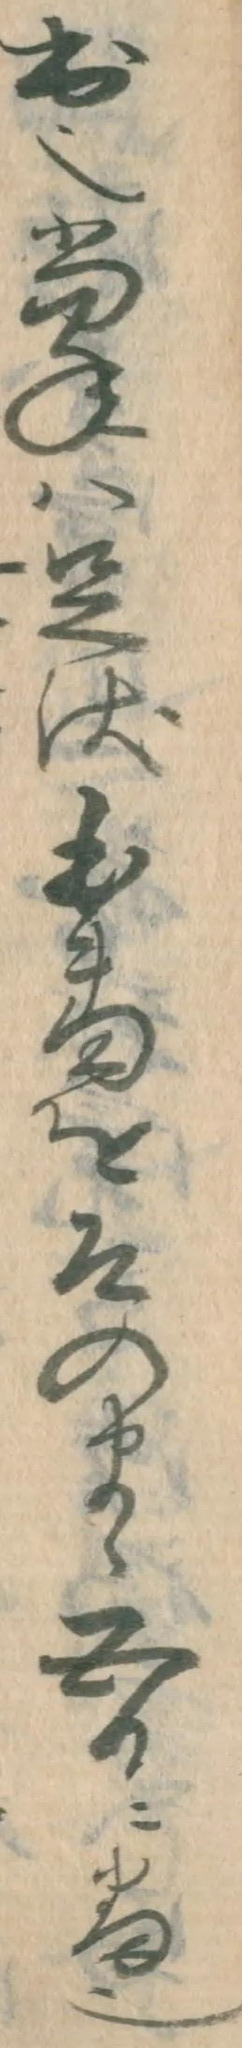出也当年ハ足伏出番をそのまゝ五日ニ当也
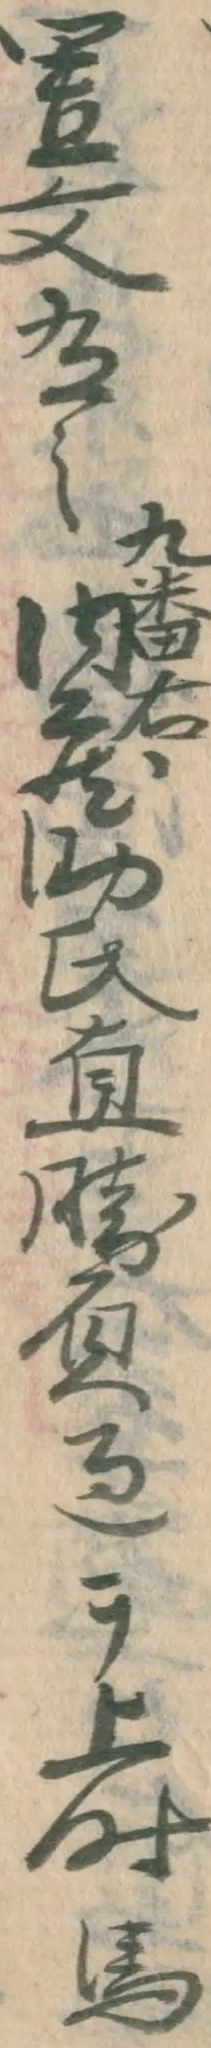置文有之◦内蔵助氏直勝負過ヲ上時馬
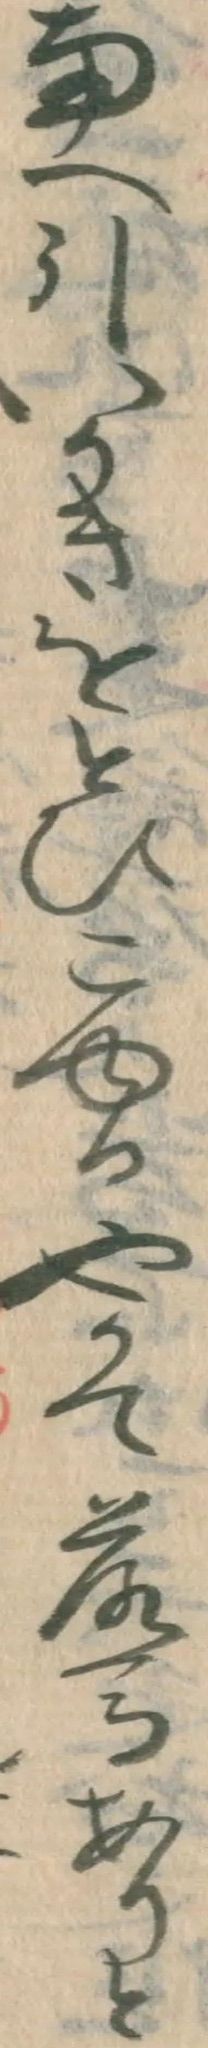南へ引いかきをとひこゆるやかて落馬ありと
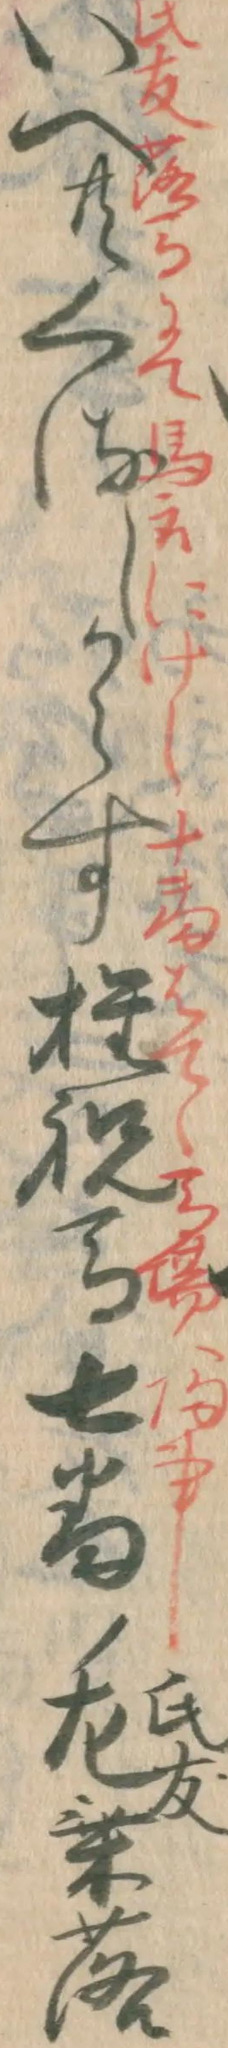いへ共くるしからす権祝馬七番ノ左乗落
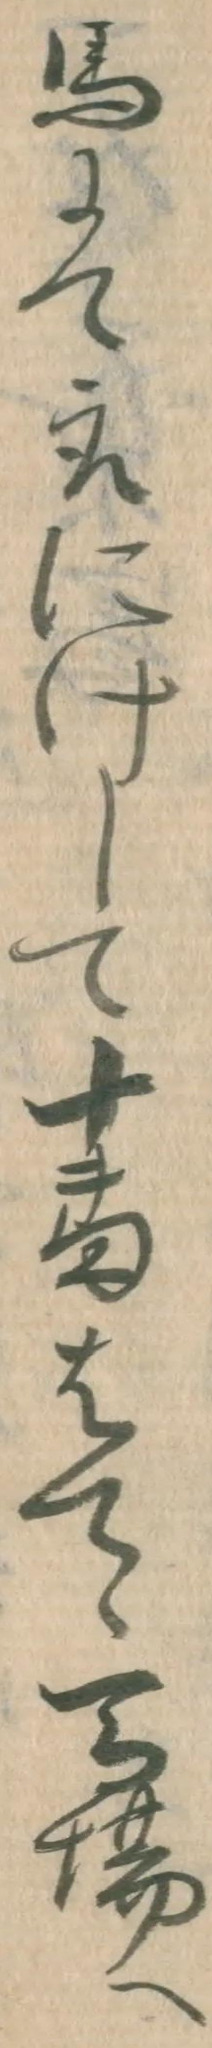馬にて取にけして十番はてゝ馬場へ
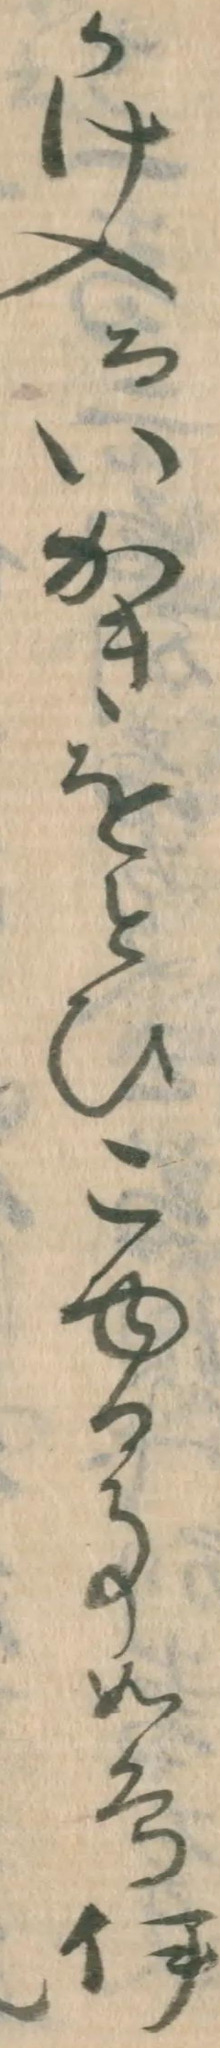かけ入るいかきをとひこゆる事如鳥伊
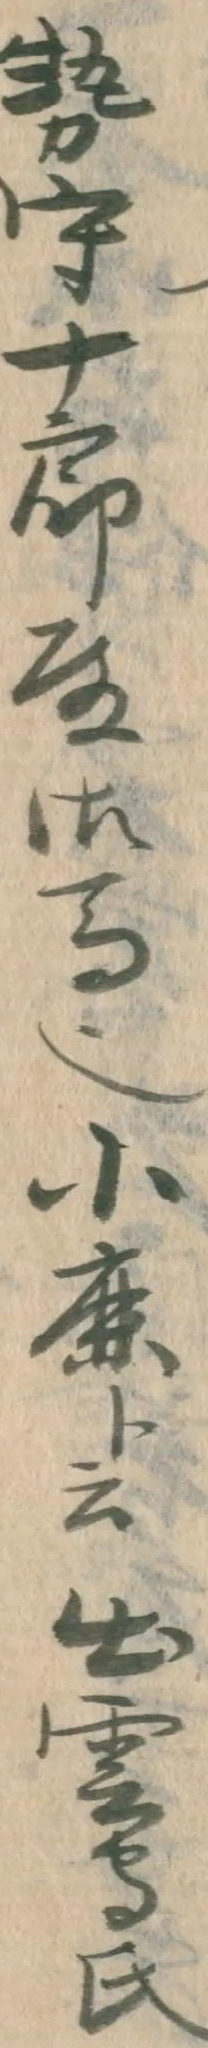勢守十郎殿御馬也小鹿ト云出雲守氏
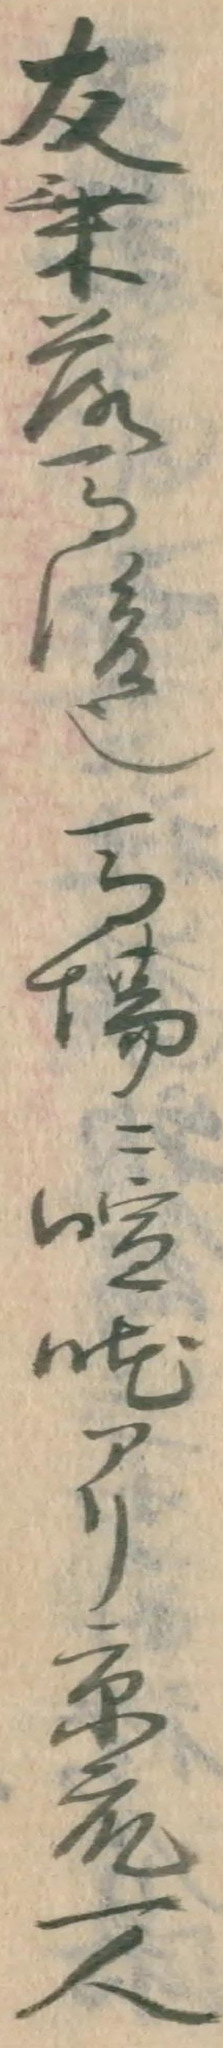友乗落馬後也馬場ニ喧嘩アリ京衆一人
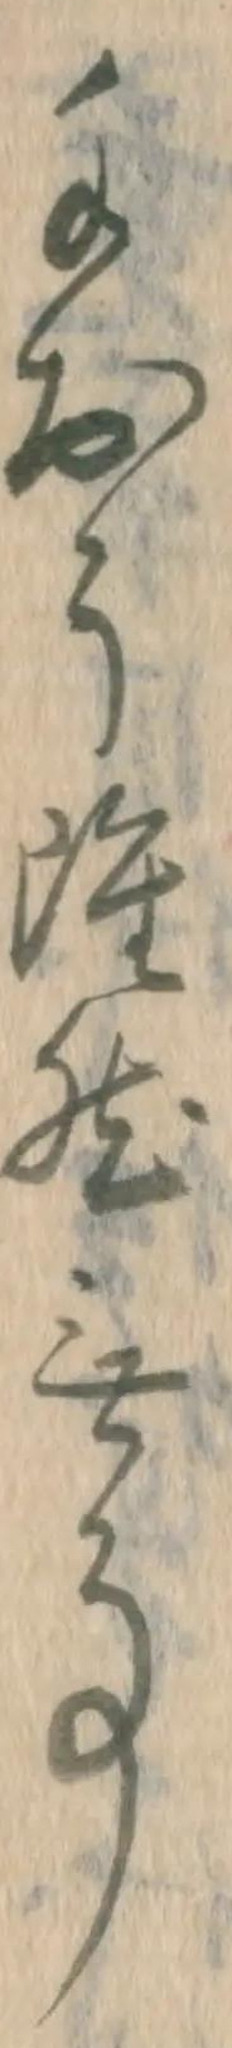手おう雖然無事
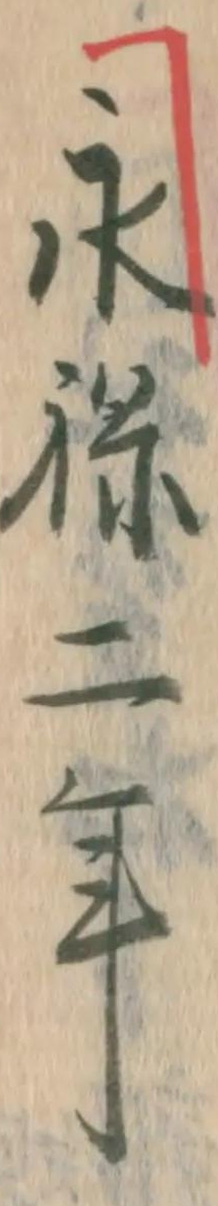永禄二年
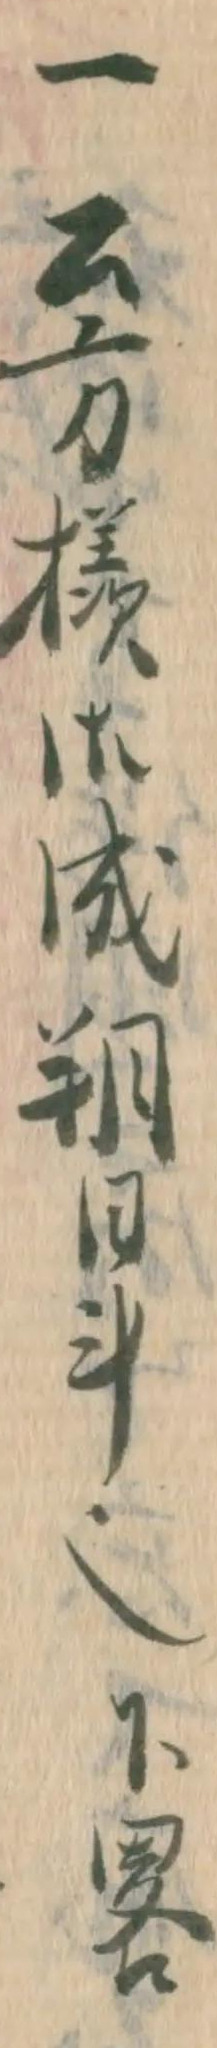一公方様御成朔日計也下略
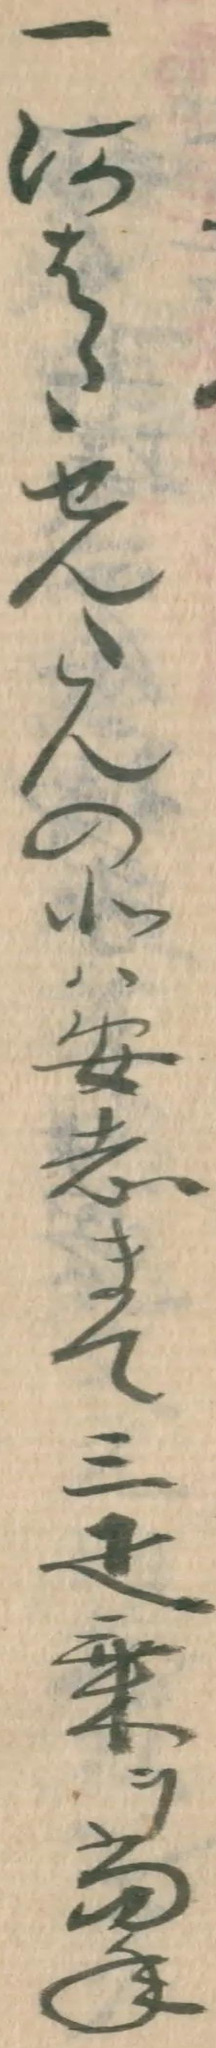一河はたせんたんの北ハ安志まて三疋乗ヲ当年
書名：賀茂社記録. 第10冊
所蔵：国立国会図書館 National Diet Library, JAPAN
